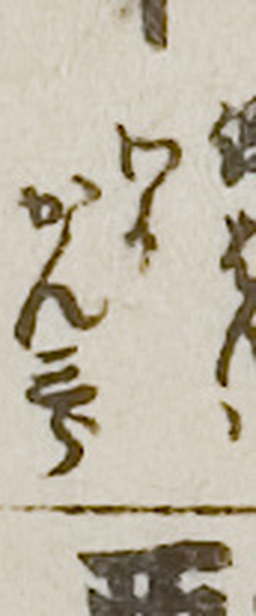かん三郎
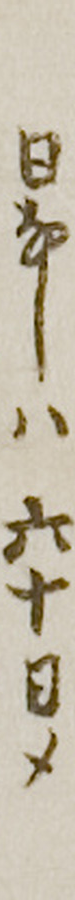日なしは六十日〆
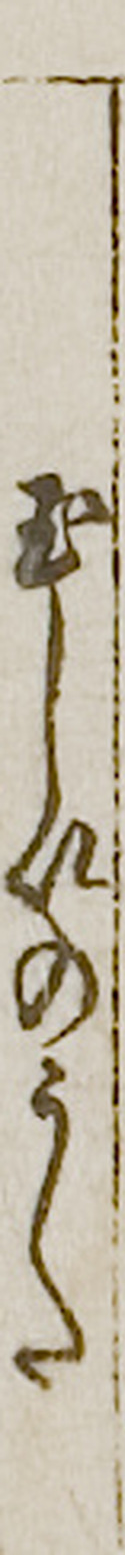たましいのうた
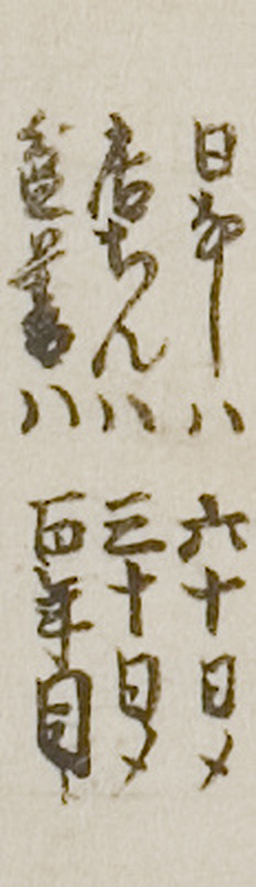店ちんは三十日〆
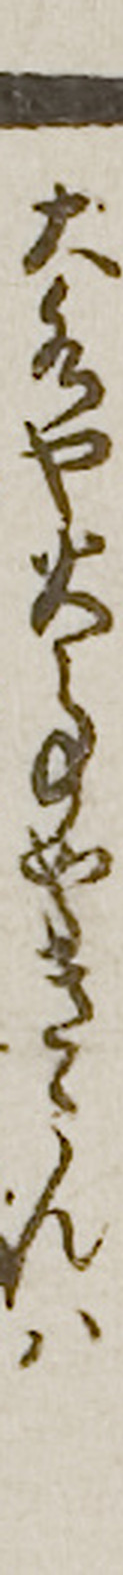大水や火事やきゝんは
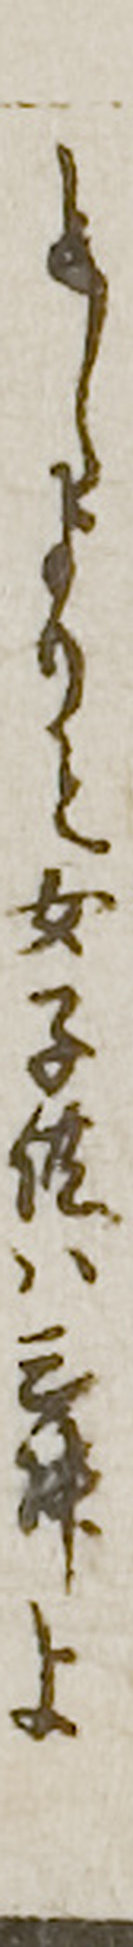としよりと女子供は三升よ
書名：天保改勢珍説増補鯰年代雑記
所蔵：東京大学総合図書館 General Library in the University of Tokyo, JAPAN
